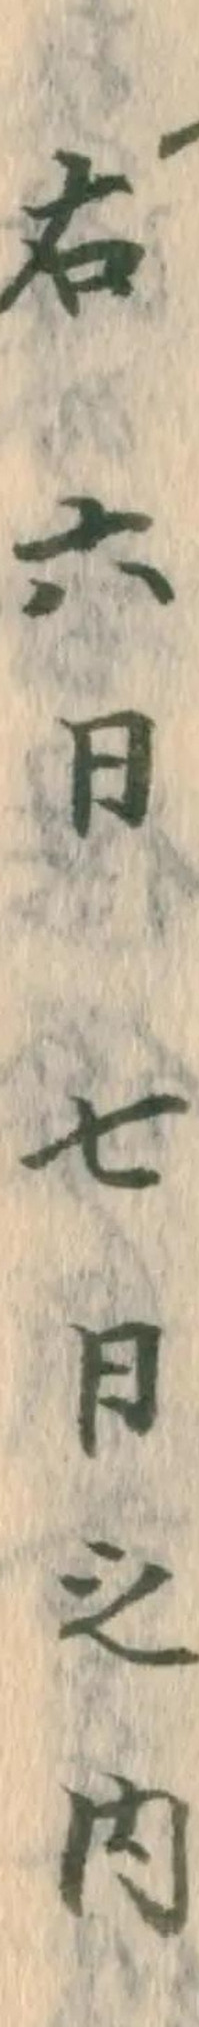右六日七日之内
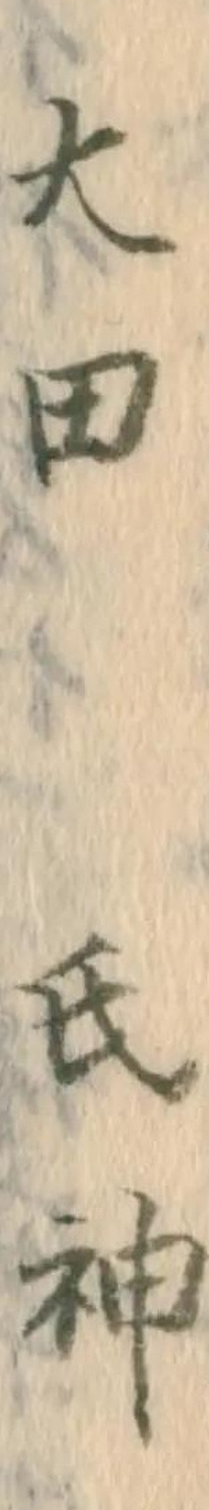大田氏神
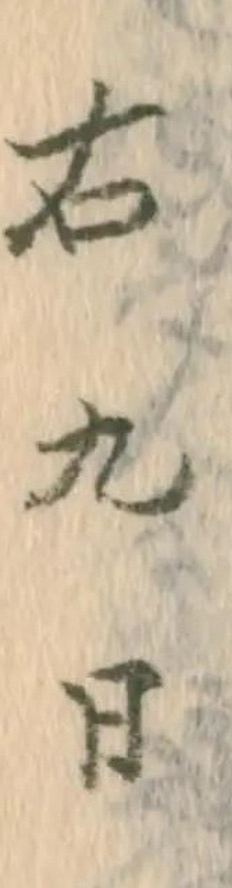右九日
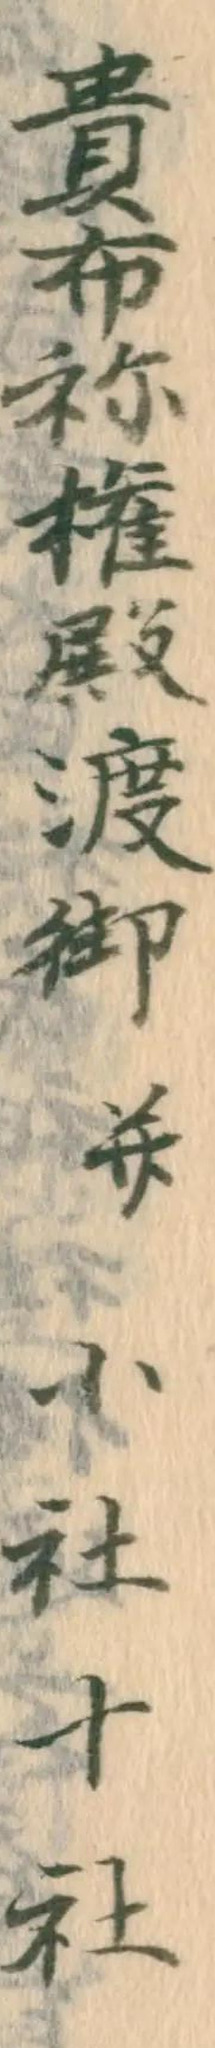貴布祢権殿渡御并小社十社
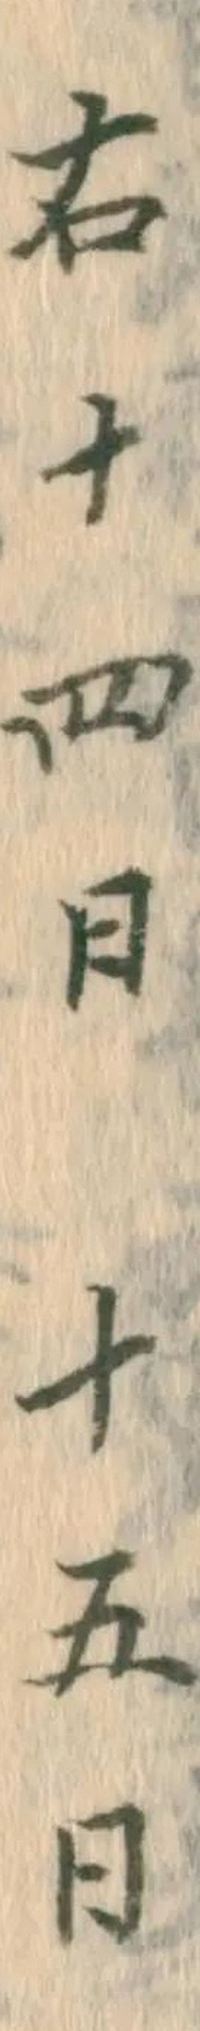右十四日十五日
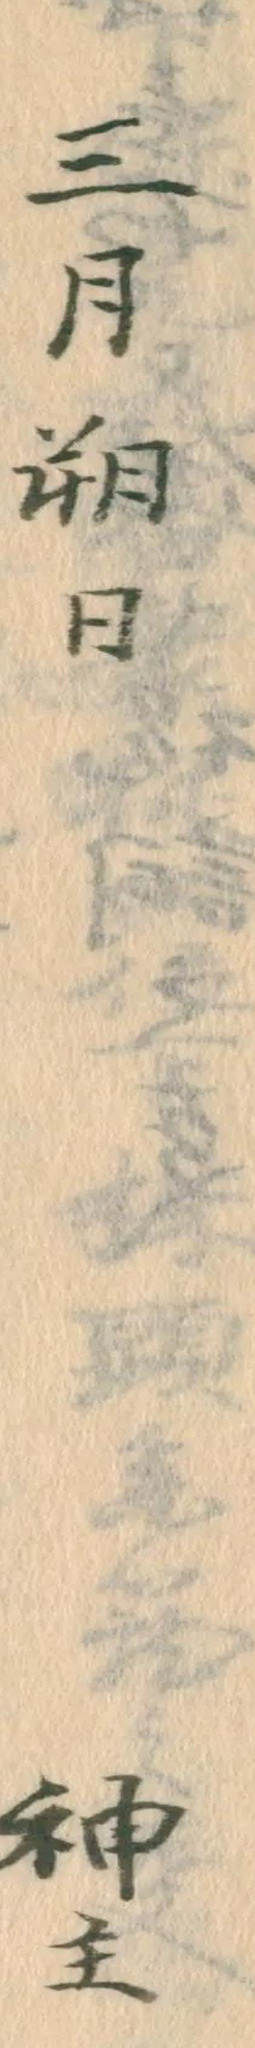三月朔日神主
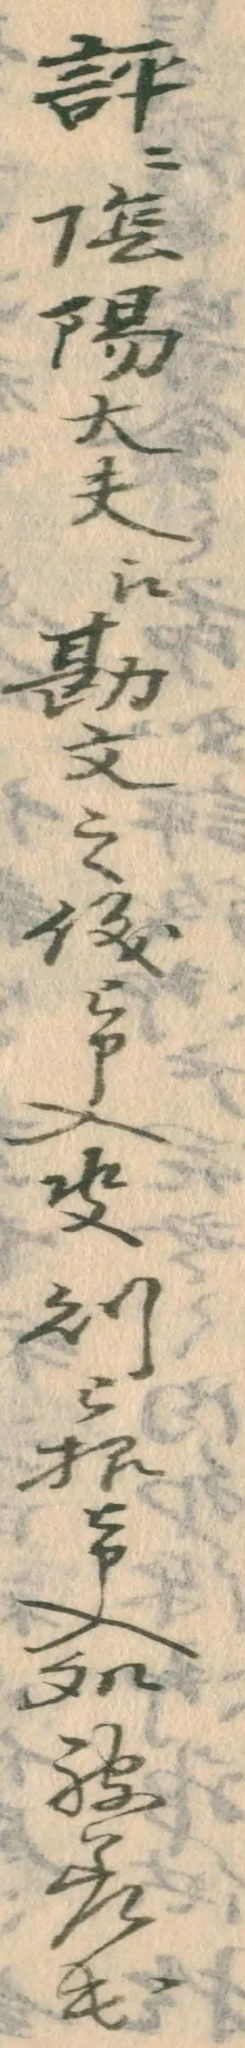評ニ陰陽大夫江勘文之儀被申入決則被招被申入処被差出
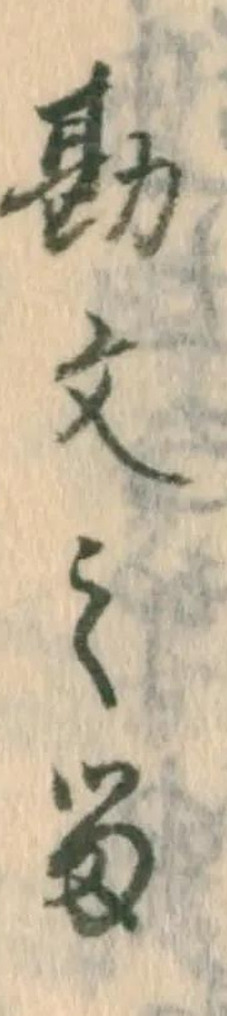勘文之留
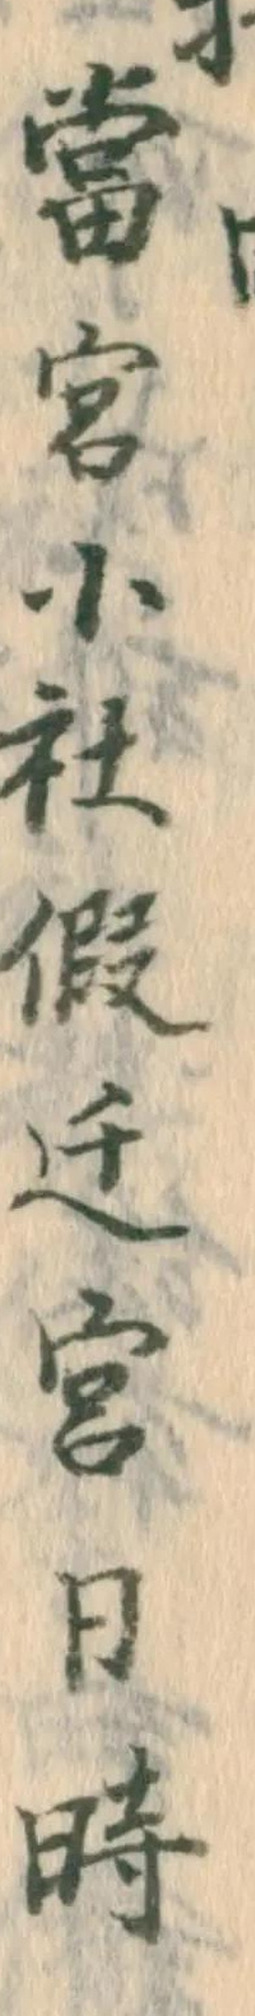当宮小社仮迁宮日時
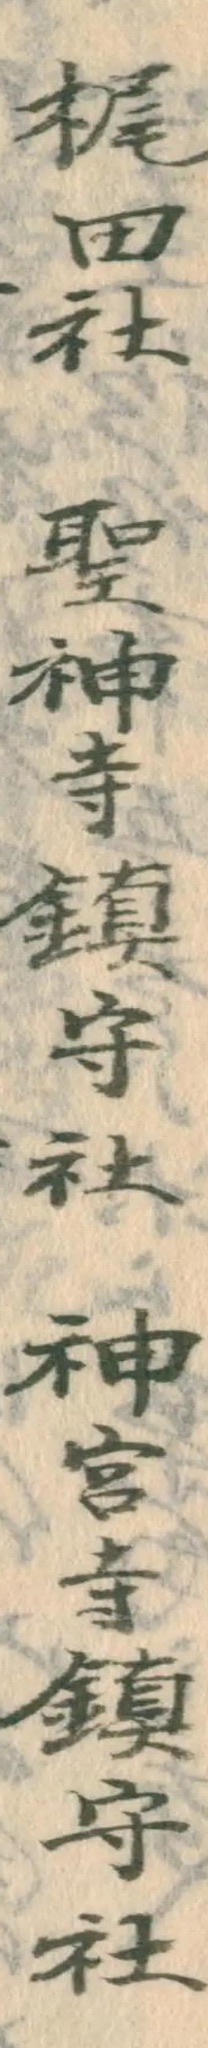梶田社聖神寺鎮守社神宮寺鎮守社
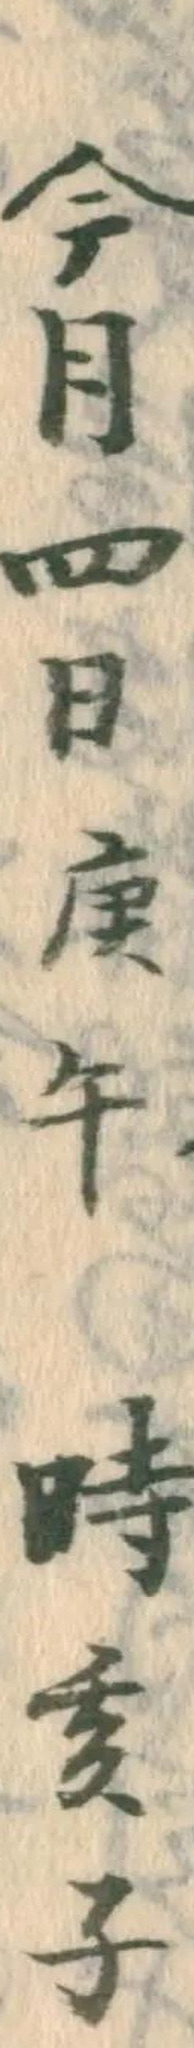今月四日庚午時亥子
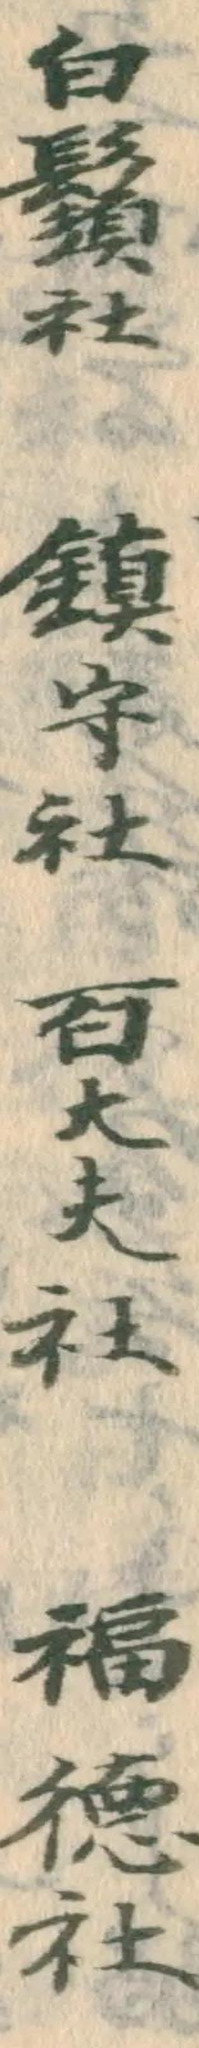白鬚社鎮守社百大夫社福徳社
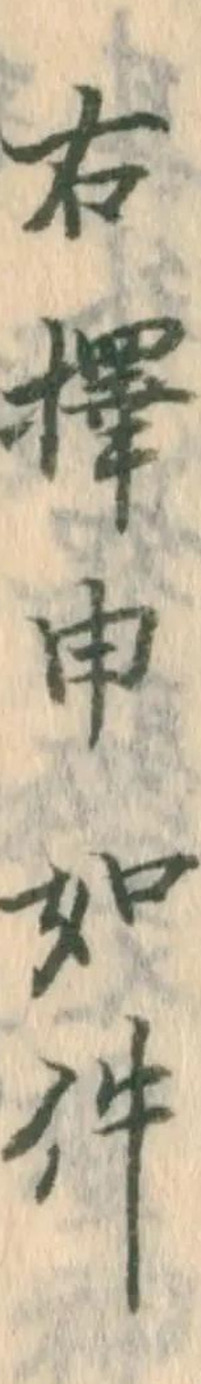右択申如件
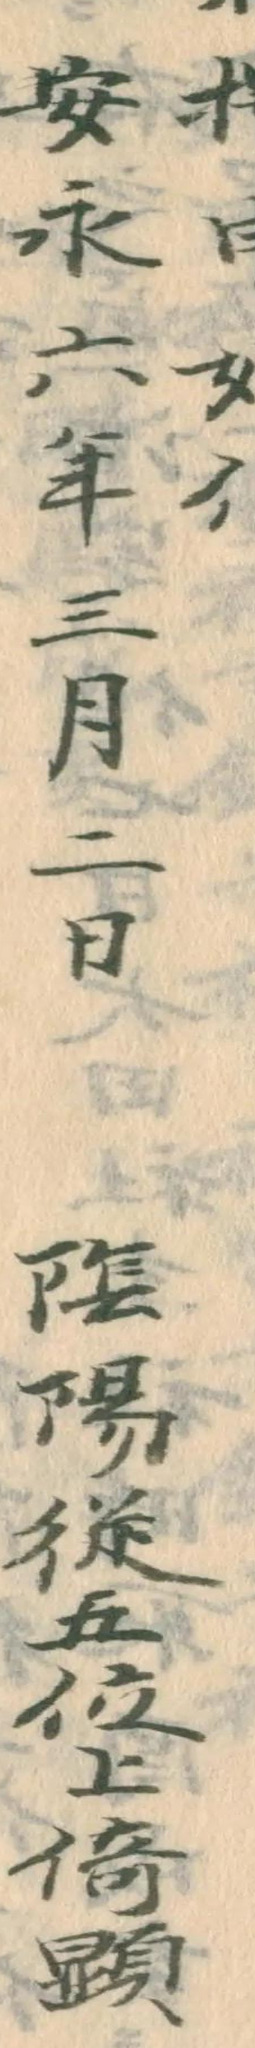安永六年三月二日陰陽従五位上倚顕
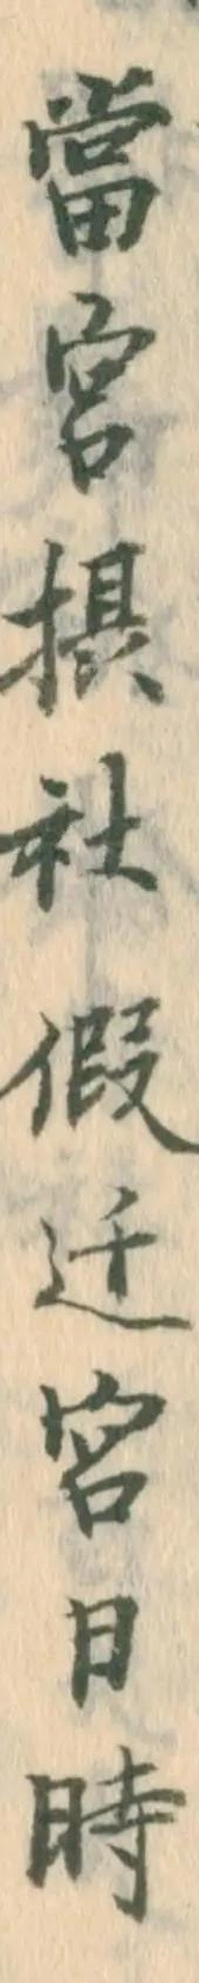当宮摂社仮迁宮日時
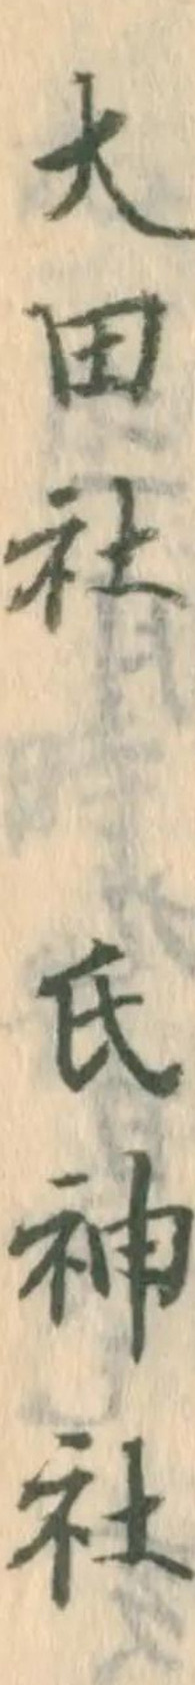大田社氏神社
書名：賀茂社記録. 第17冊
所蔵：国立国会図書館 National Diet Library, JAPAN
